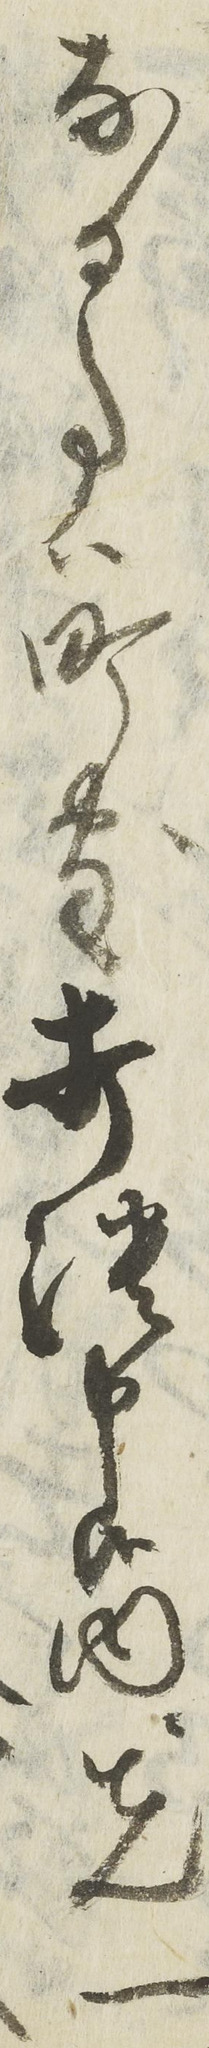なる事は町家打潰申候内ニ先一
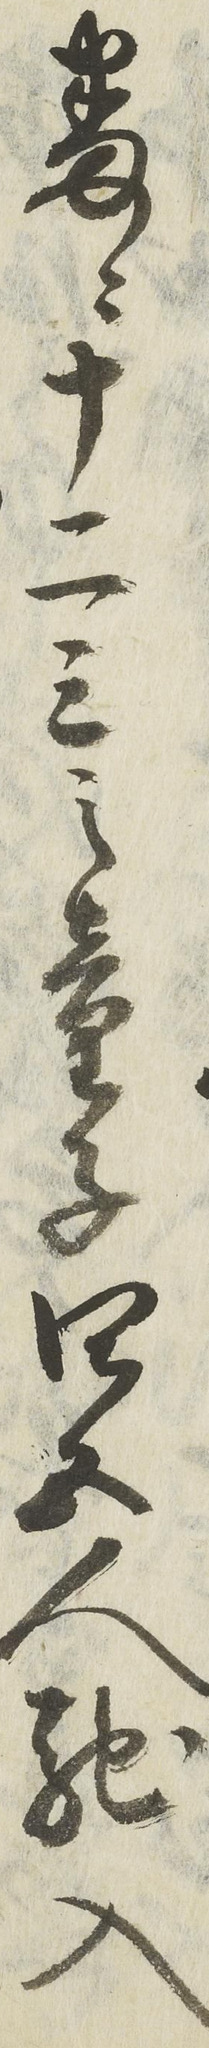番ニ十二三之童子四五人馳入
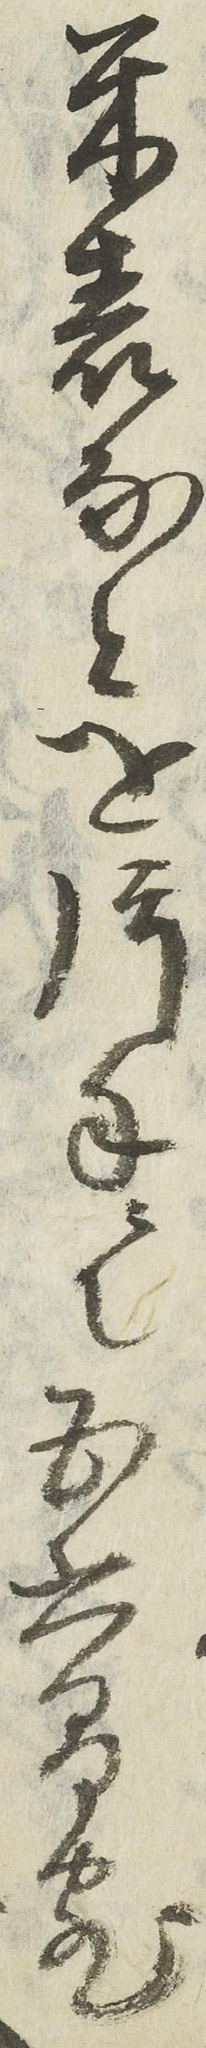米表なとを片手ニて五六間宛
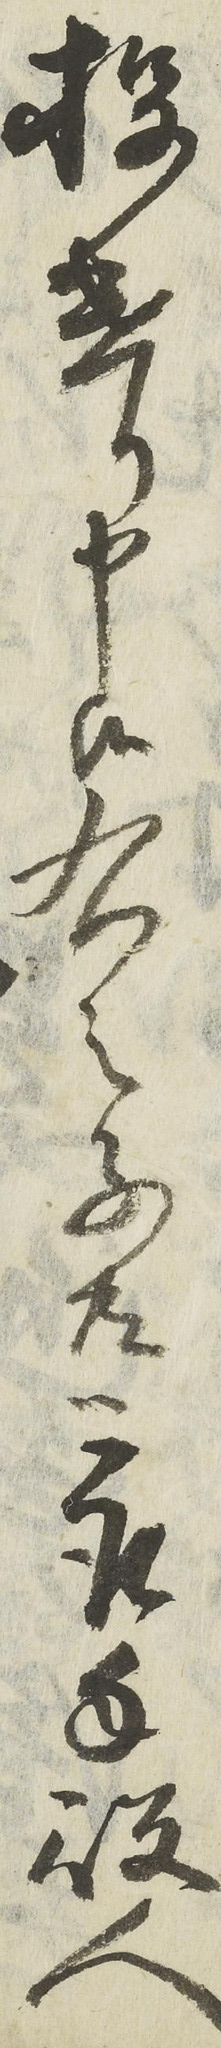投遣り申候右之子共は取手役人
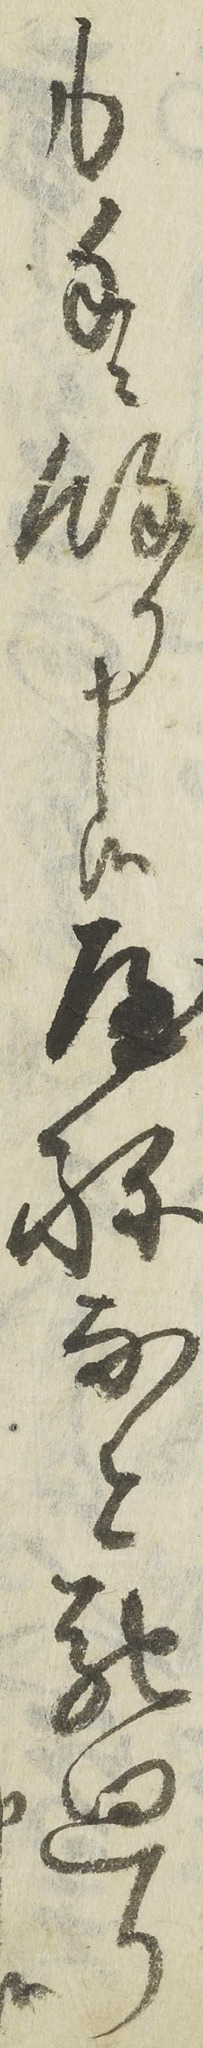も手ニ余り申候屋ねなと馳廻り申候

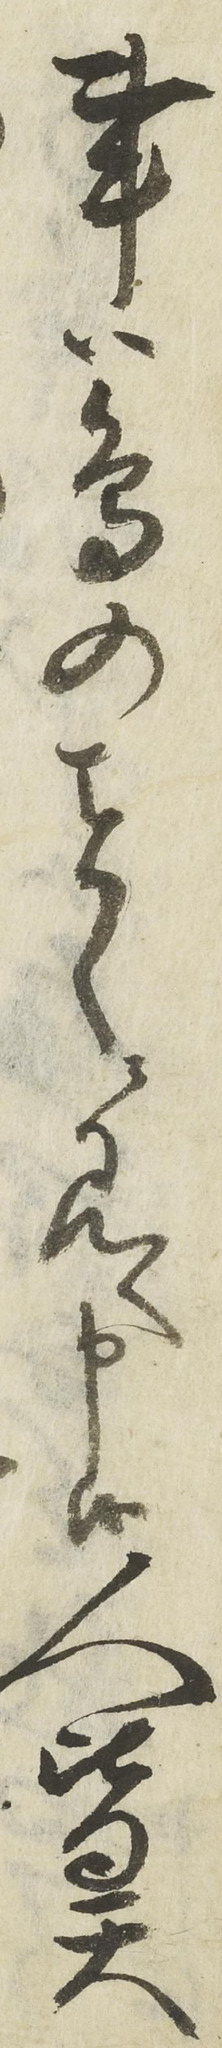事は鳥のことくニ見へ申候人皆天
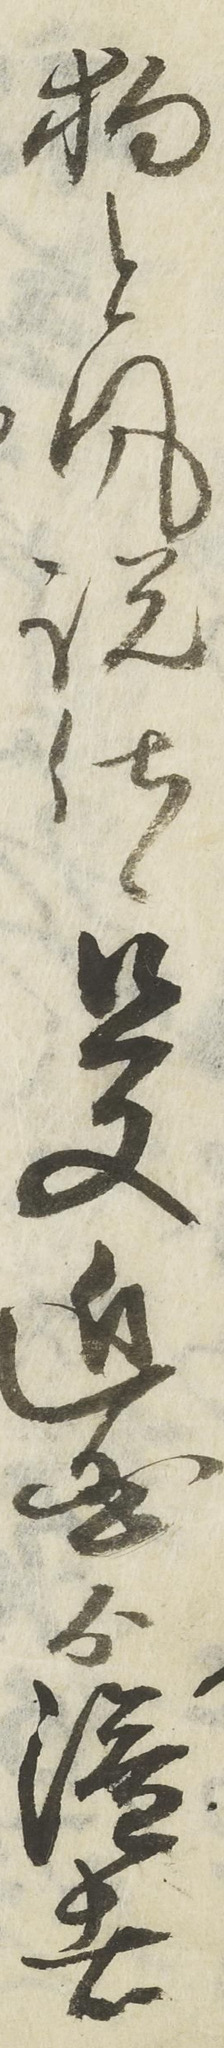狗と風説仕候且又近国ゟ溢物
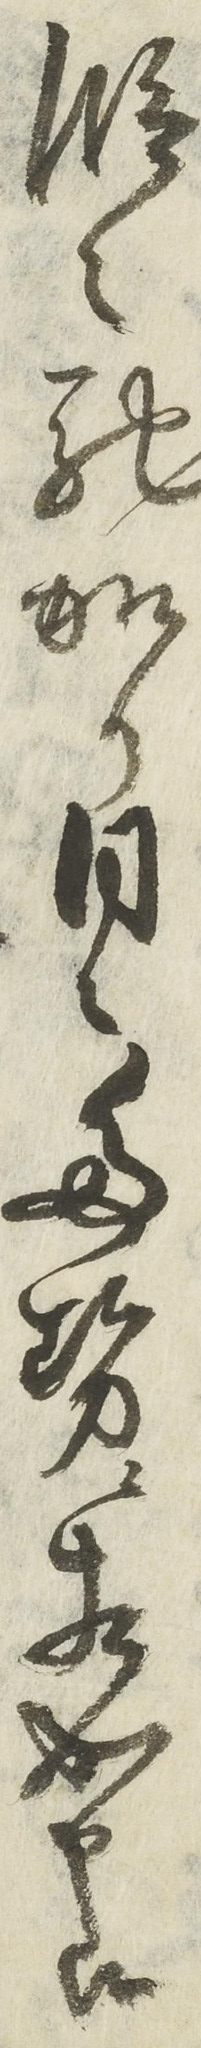段々馳加り日々多勢ニ相成申候
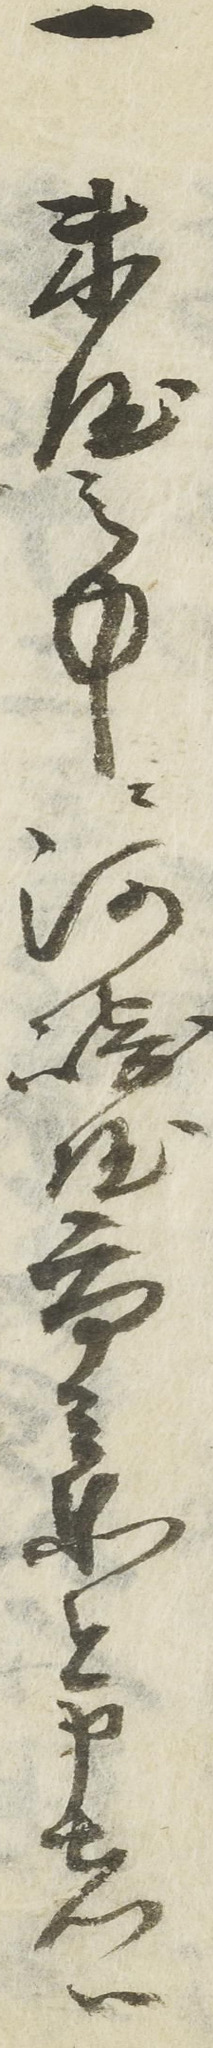一米屋之中ニ河崎屋市兵衛と申者は
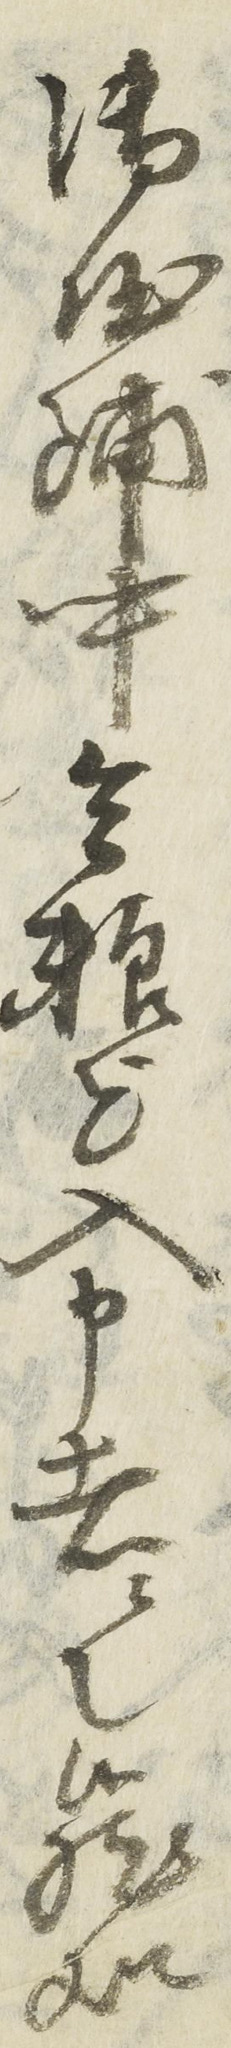御屋鋪中兵粮を入申者ニて候然処
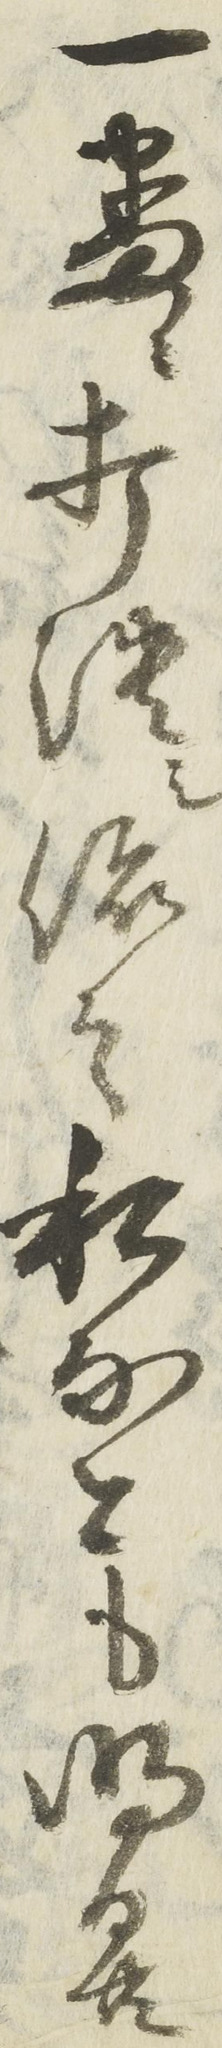一番ニ打潰シ依之私なとも明日共
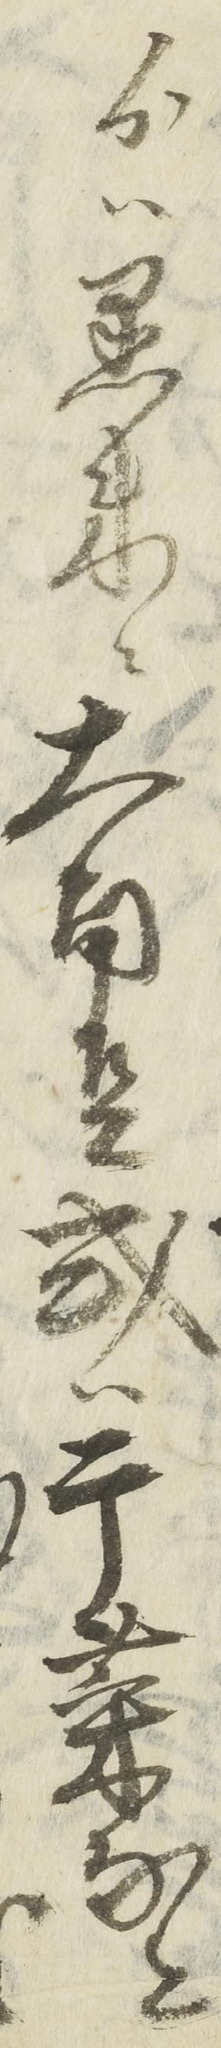ゟは黒米ニ大角豆或は干菜なと
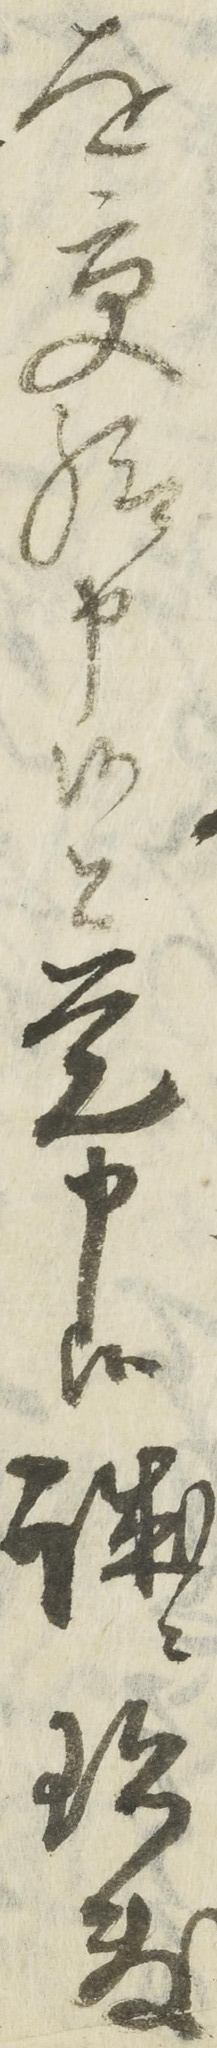を受給申候と覚申候誠ニ珍敷
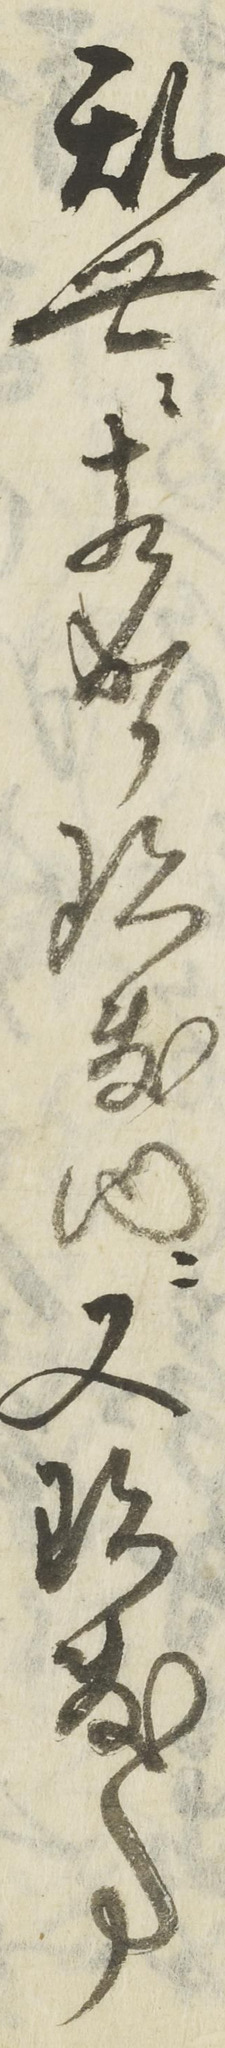乱世ニ相成り珍敷内ニ又珍敷事
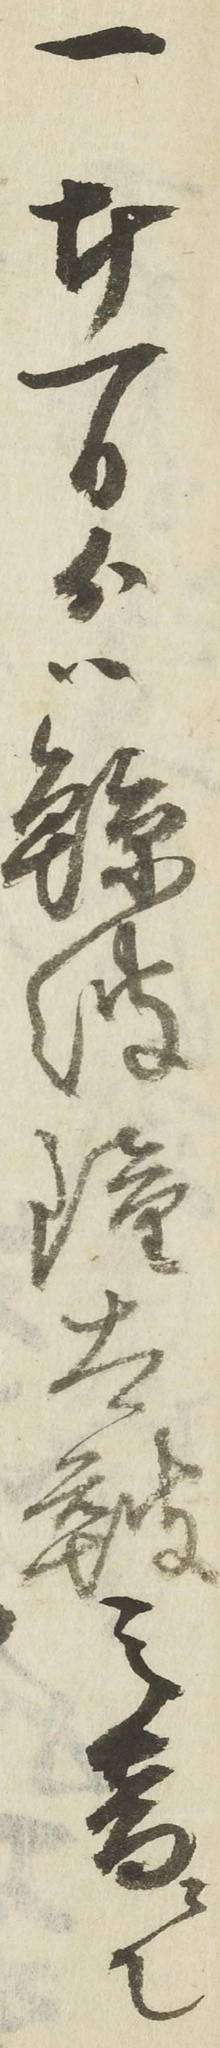一廿一日ゟは鯨波鐘太鼓之音ニて
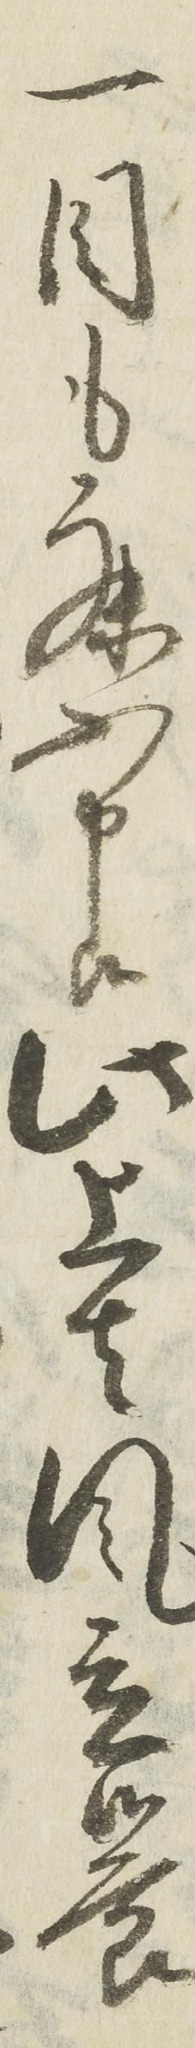一目も寝不申候此上は風立候節
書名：後見笑
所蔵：東京大学地震研究所図書室 Earthquake Research Institute Library, The University of Tokyo, JAPAN
